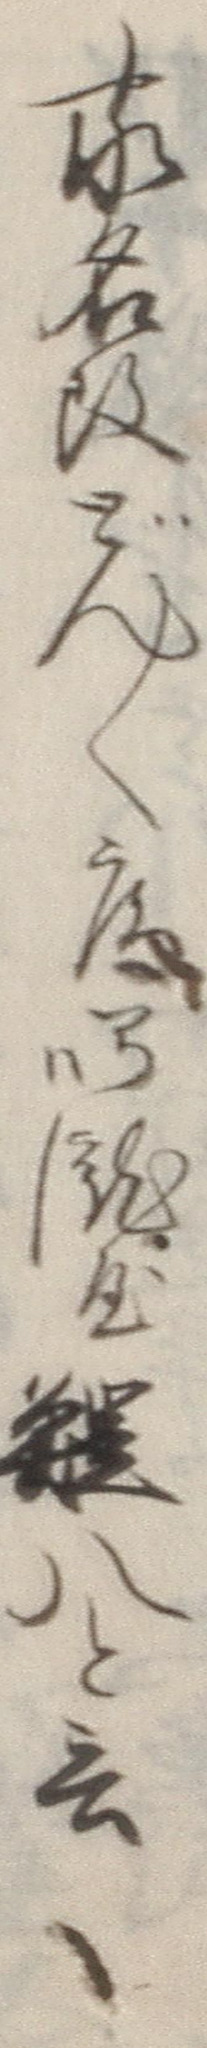家名改どん〳〵？？龍屋難八と云
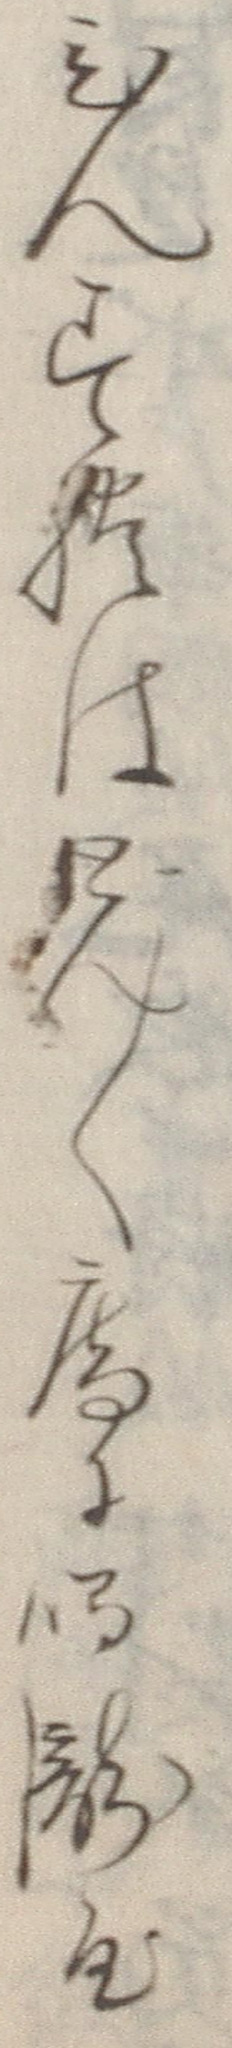ひんすれはどん〳〵鷹に鳴龍屋
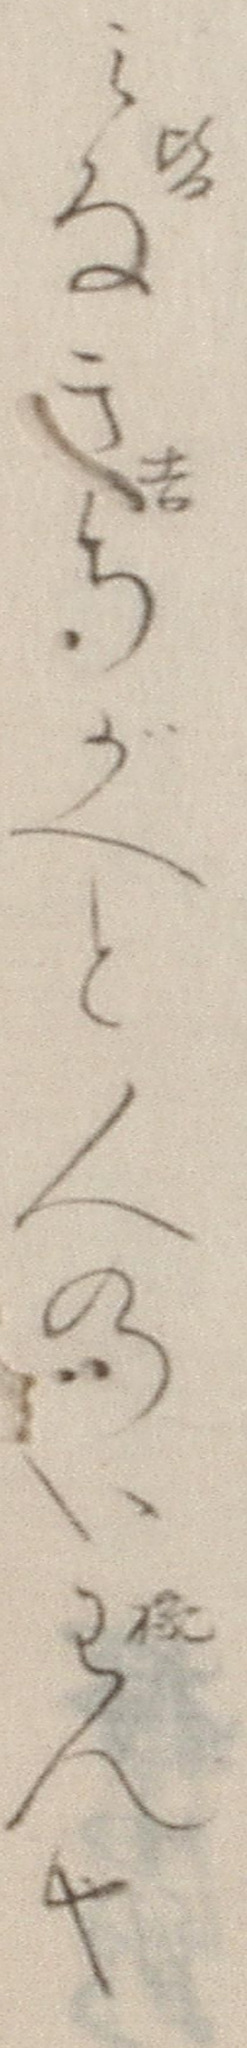みなきちがへ人のいわんや
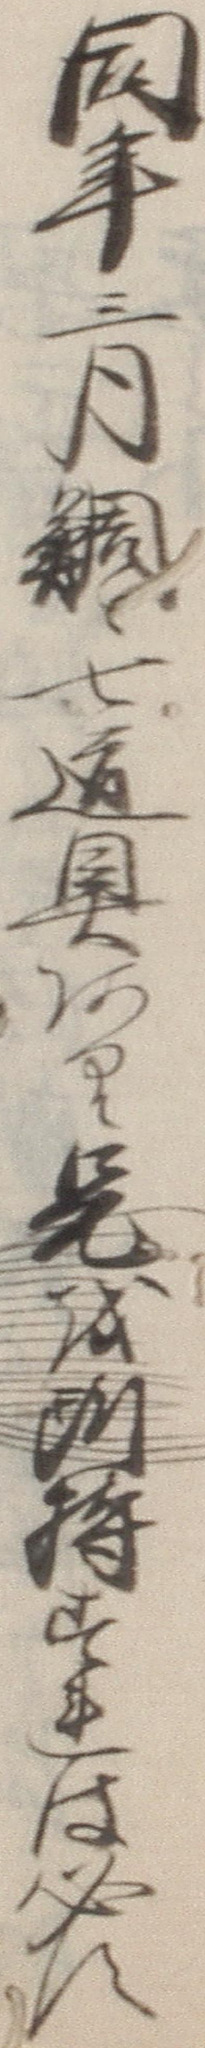同年三月鯛七道具あり是を所持すれは必す
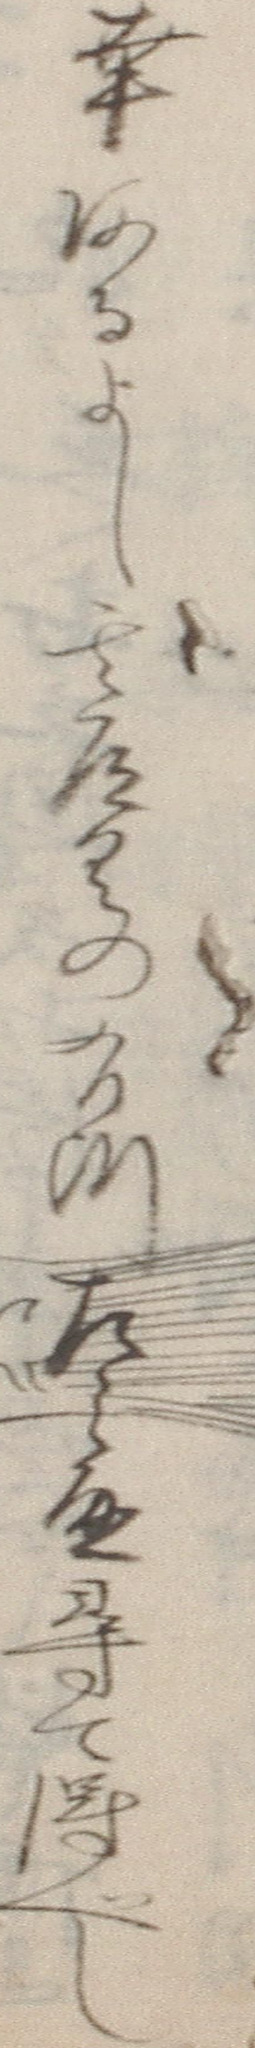幸あるよし其道具有所左の通尋て得べし
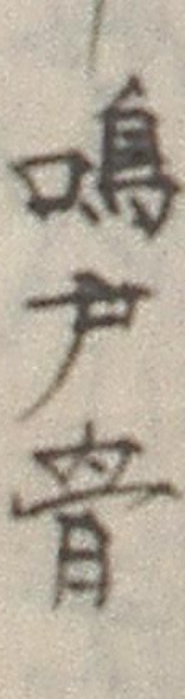鳴門骨
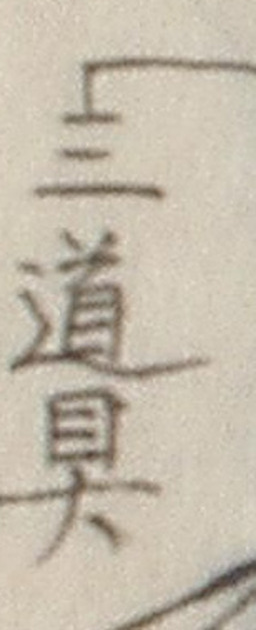三道具

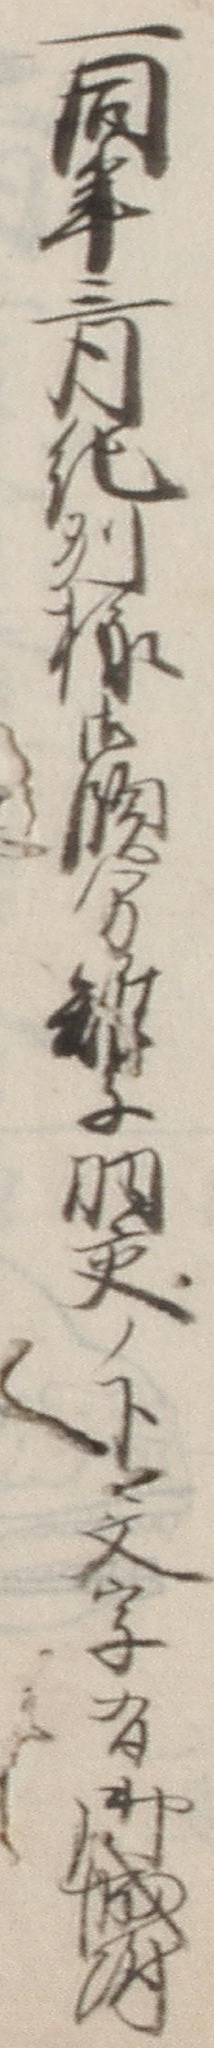一同年三月紀州様御領分雉子羽交ノ下文字有御城附
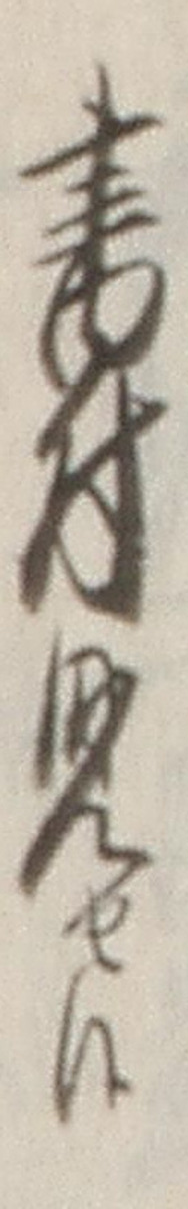書付見セ候
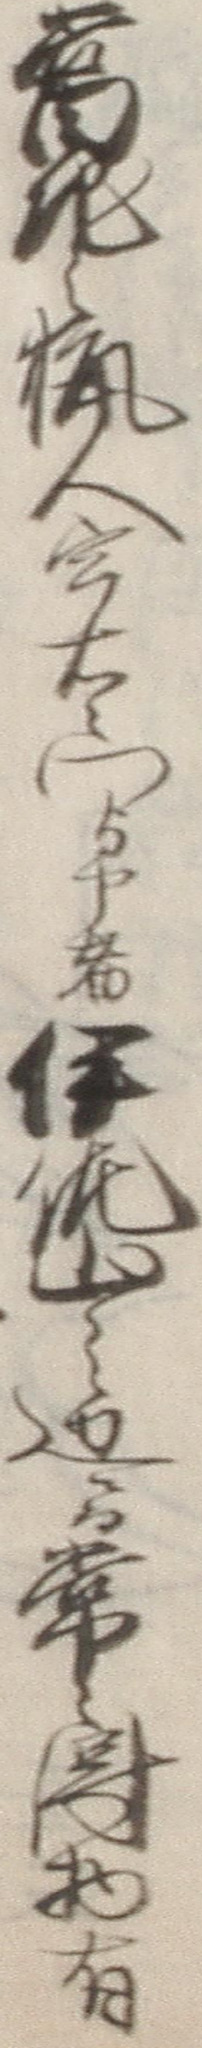当地の猟人宇右衛門と申者伊作山之近ニ而常々得物有
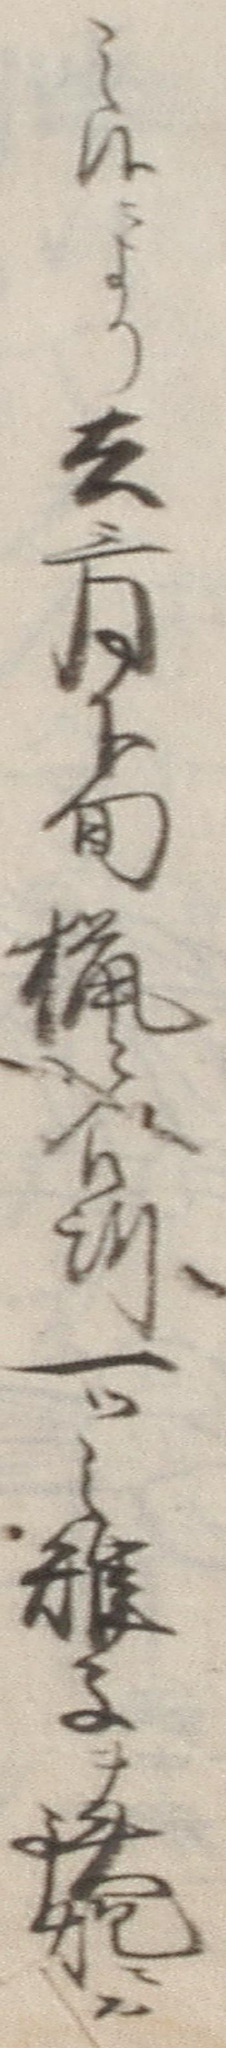之候ニより去三月下旬猟ニ候所一ツ雉子ヲ鉄砲ニ而
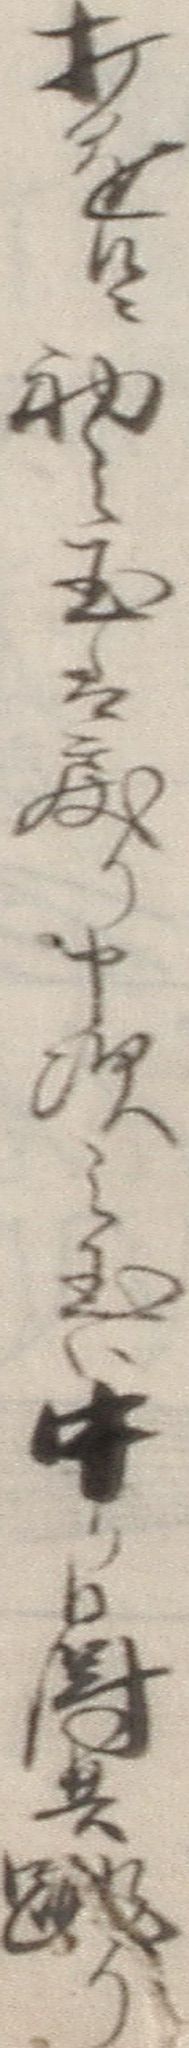打懸候ニ初之玉は戻り中次之玉ニ中り候得共跳り
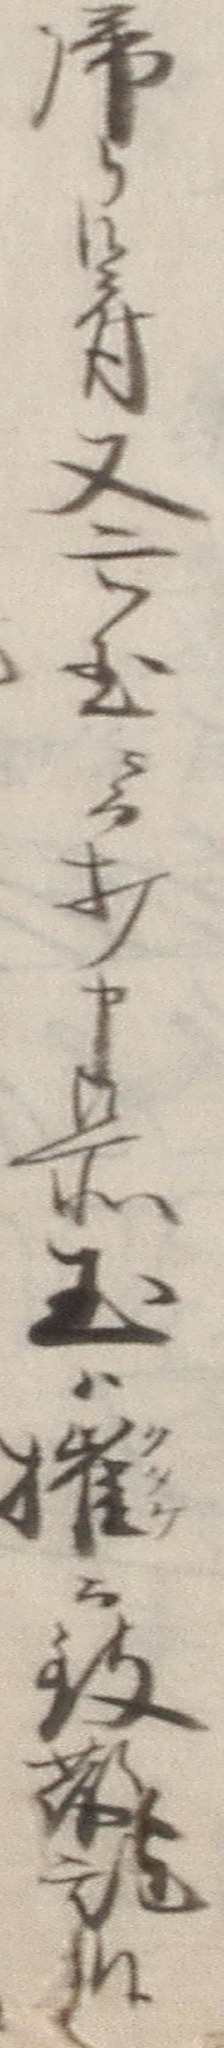帰り候ニ付又二ツ玉ニ而打申候所玉ハ摧而致散乱候
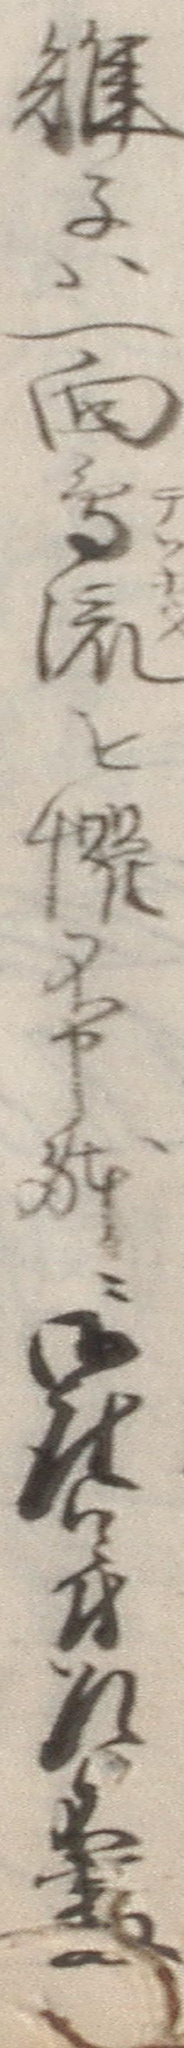雉子ハ一向鳥流を懼不申躰ニ御座候ニ付乍不審
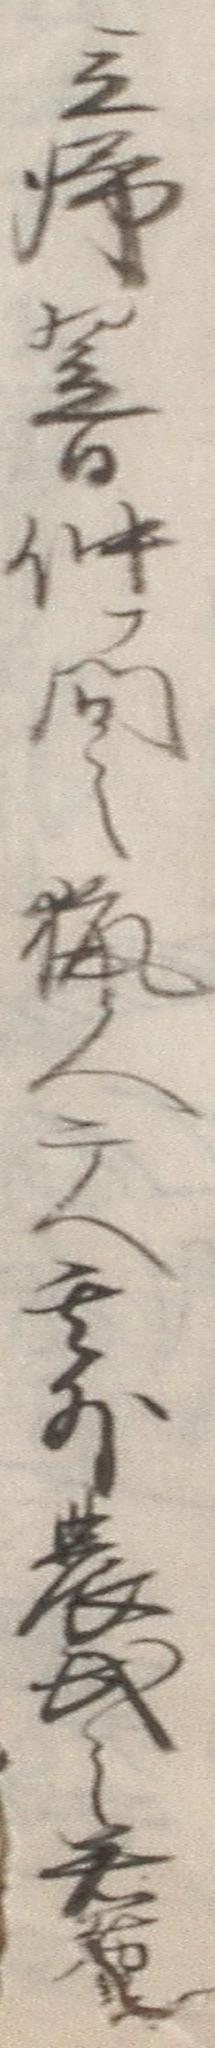立帰翌日仲ケ間の猟人二人其外農民の若者共
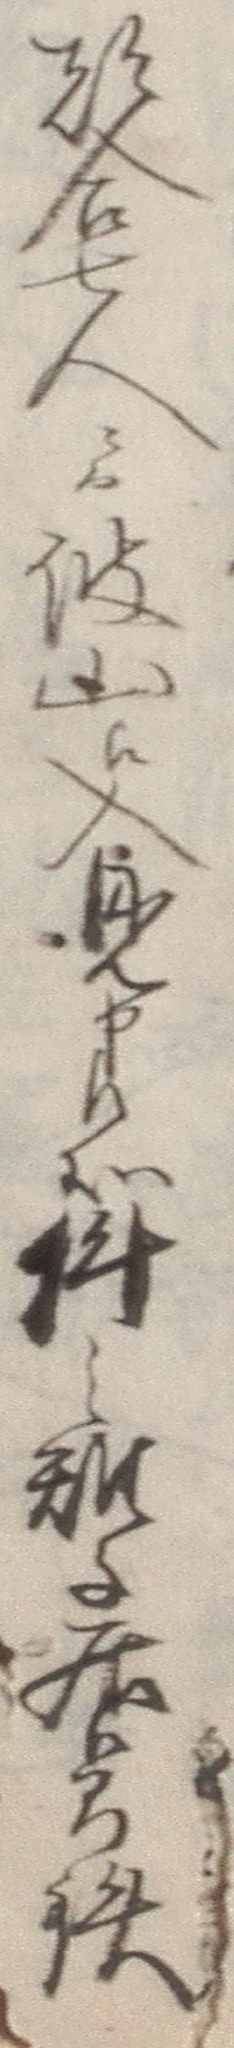都合七人ニ而彼山え入見申候処件の雉子居候弓鉄
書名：[諸国災害記録]
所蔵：東京大学地震研究所図書室 Earthquake Research Institute Library, The University of Tokyo, JAPAN
